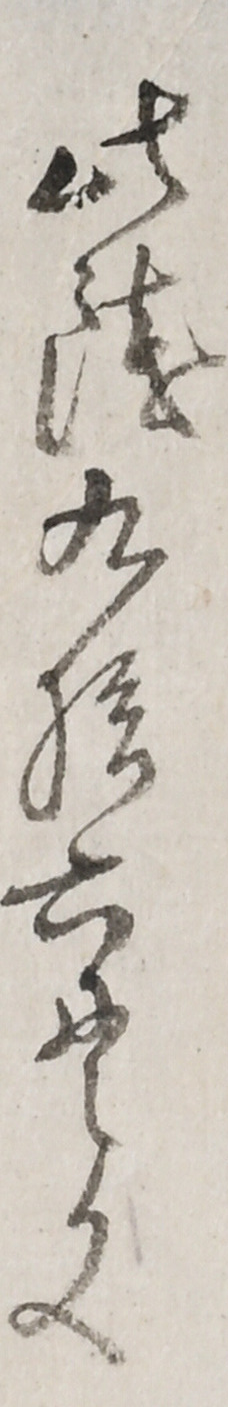此銭九拾六貫文
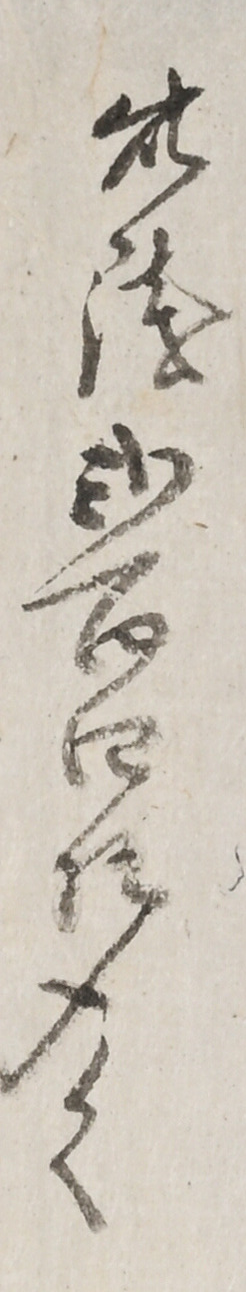此銭弐百四拾〆文
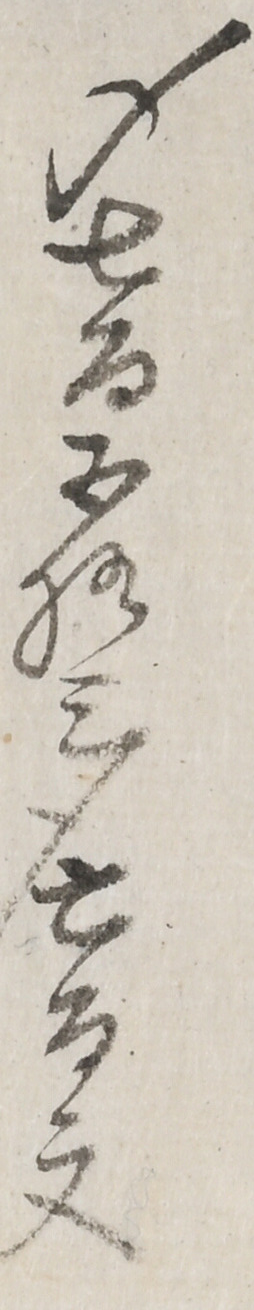〆七百五拾三〆六百文
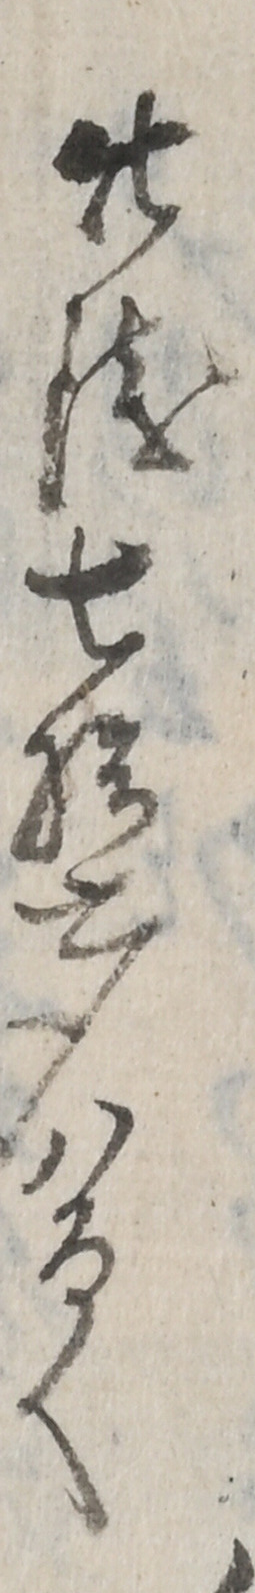此銭七拾六〆八百文
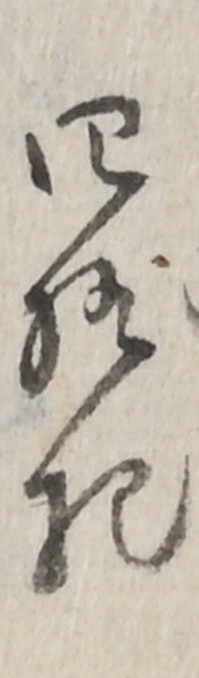四拾把
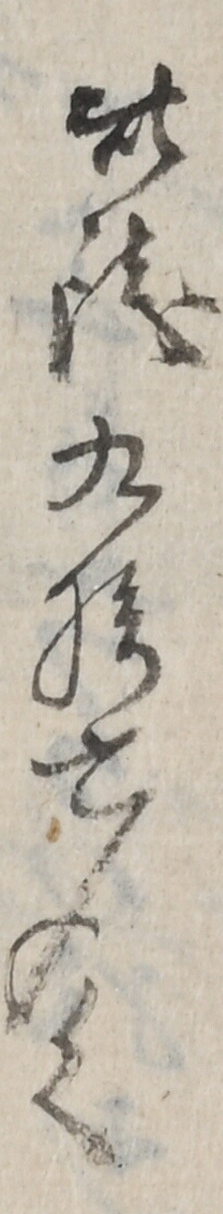此銭九拾六貫文
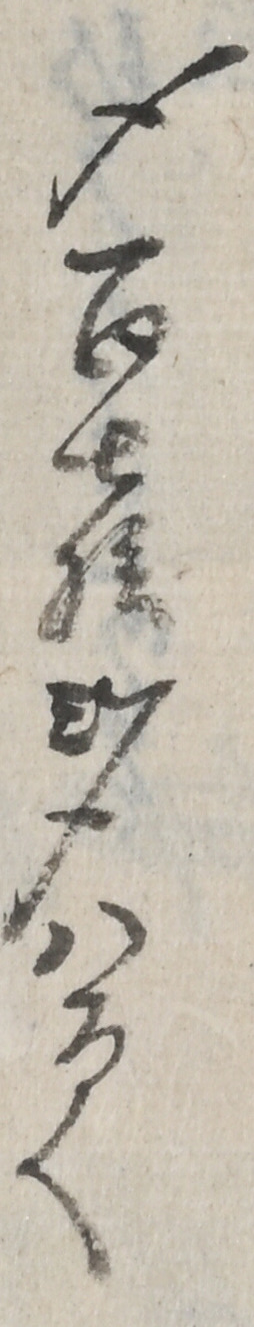〆百七拾弐〆八百文
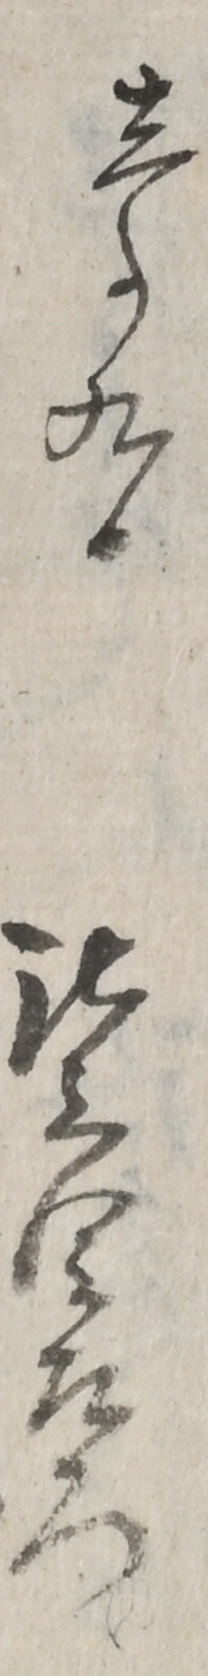十二月九日池上金左衛門
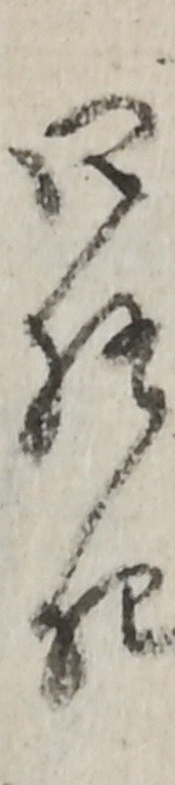四拾把

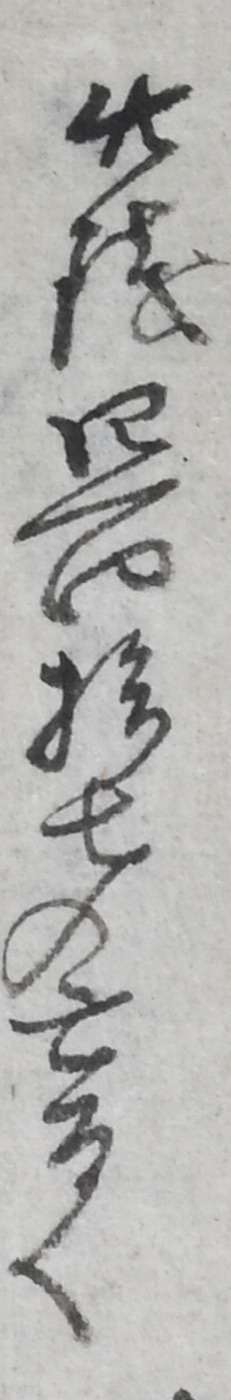此銭四百拾七〆六百文
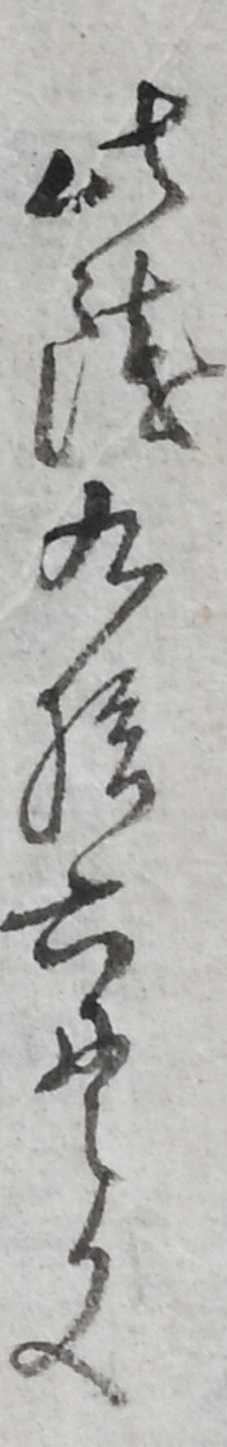此銭九拾六貫文
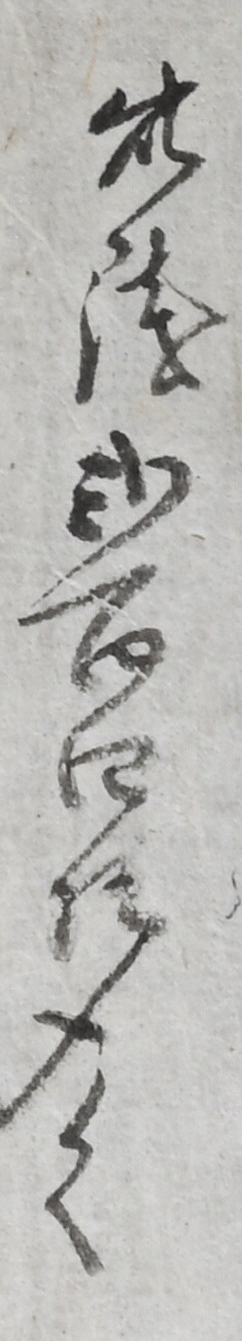此銭弐百四拾〆文
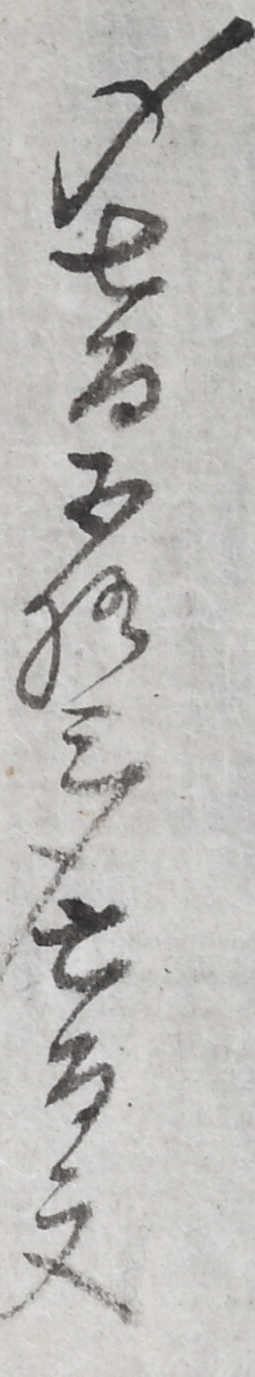〆七百五拾三〆六百文
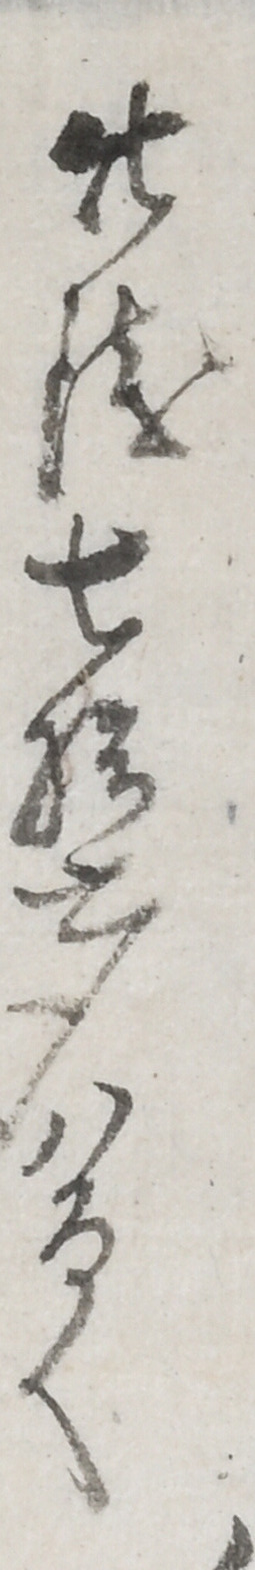此銭七拾六〆八百文
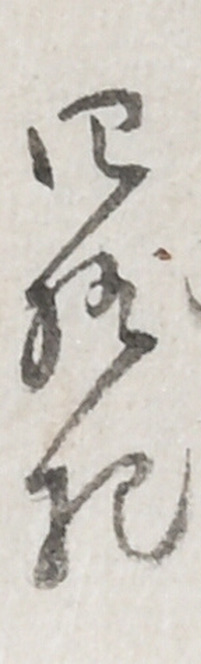四拾把
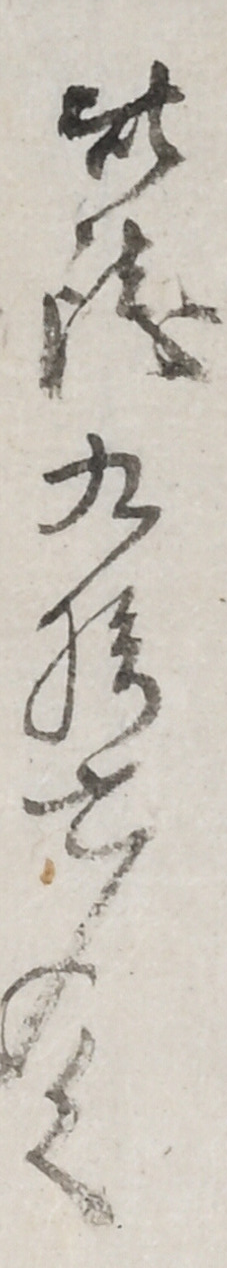此銭九拾六貫文
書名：信濃全國楮幣引換御用控
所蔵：伊那市立高遠町図書館・合同会社AMANE
